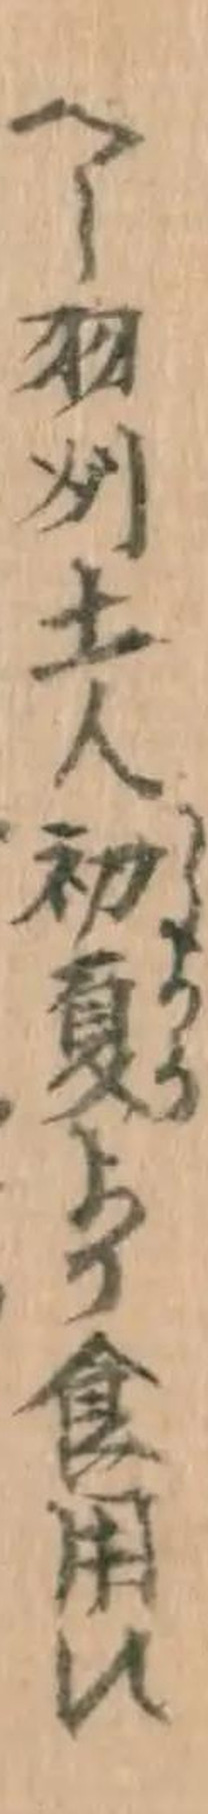へし羽州土人初夏より食用す
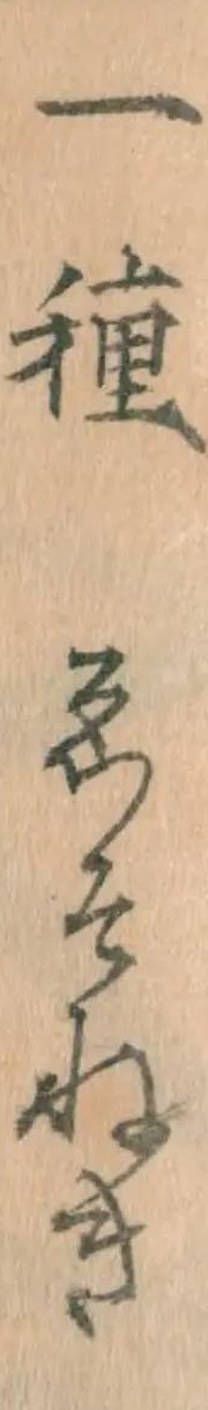一種ゑそねき
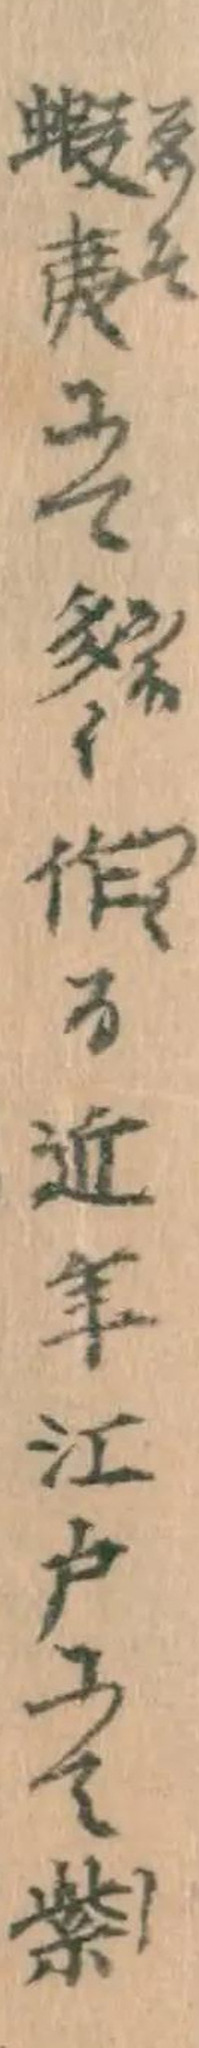蝦夷にて多く作る近年江戸にて紫
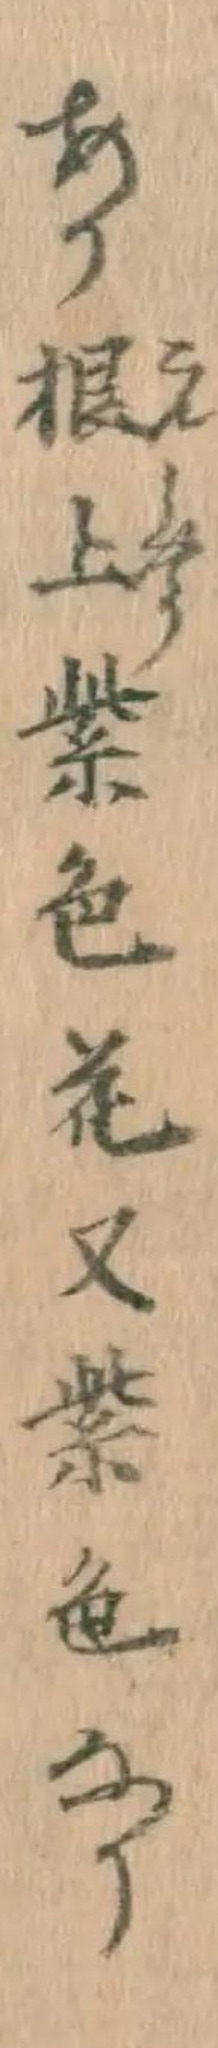あり根上紫色花又紫色なり

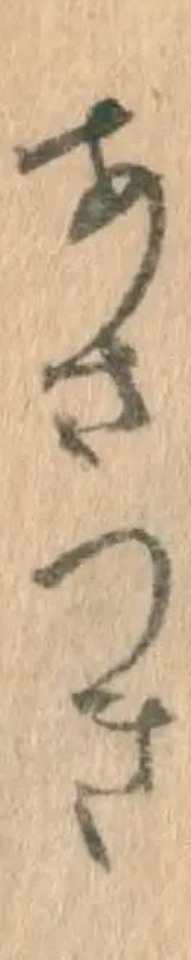あさつき
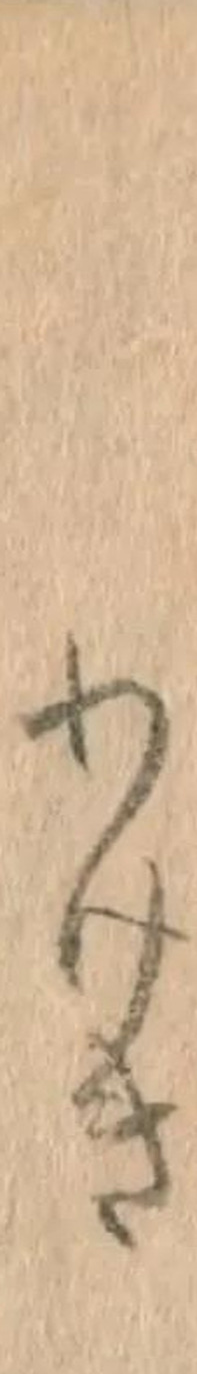わけき
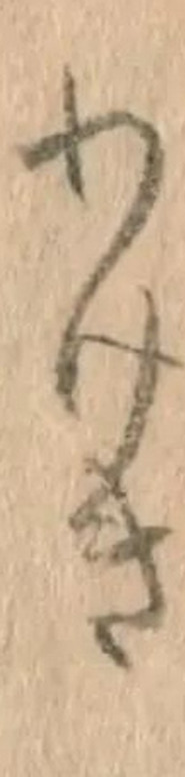わけき
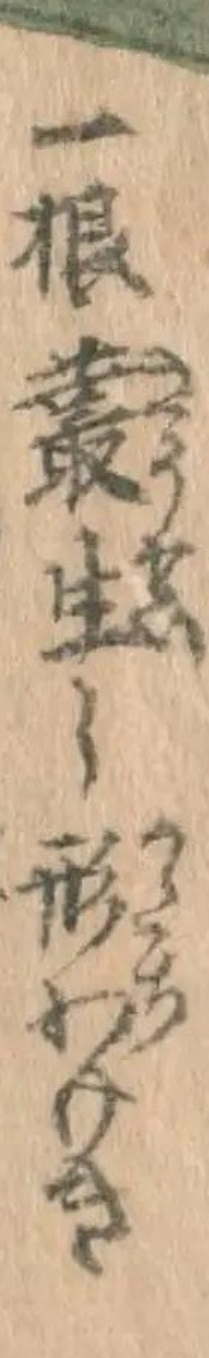一根叢生し形わけき
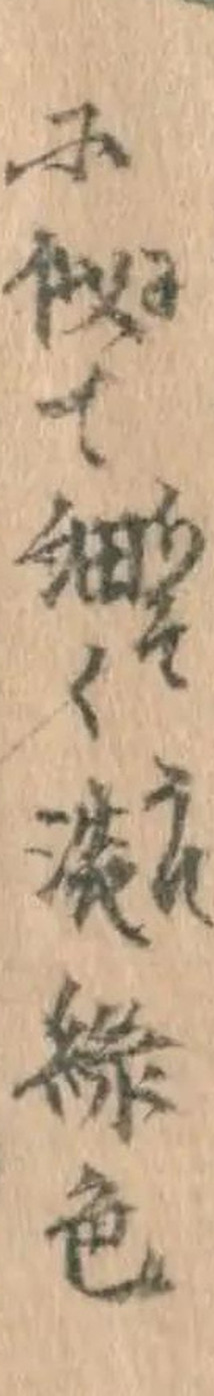に似て細く淡緑色
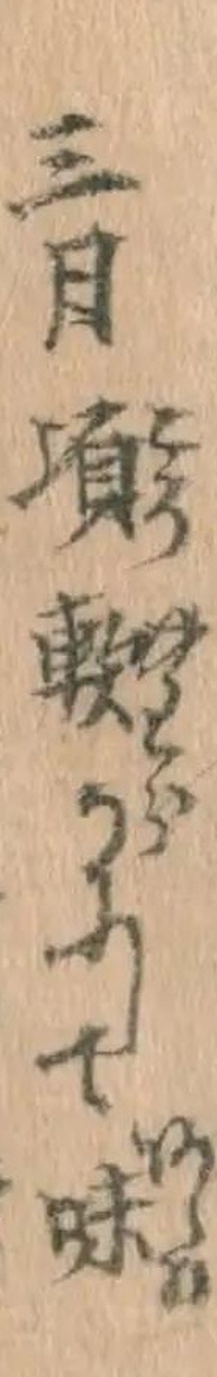三月頃軟かにして味
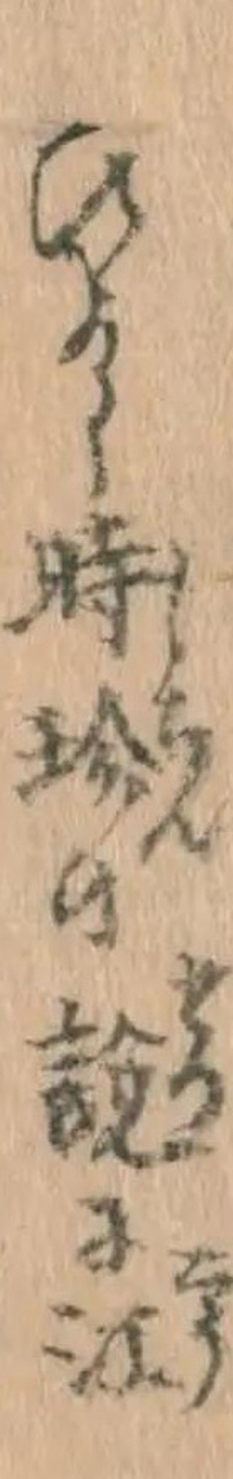ひよし時珍の説に江
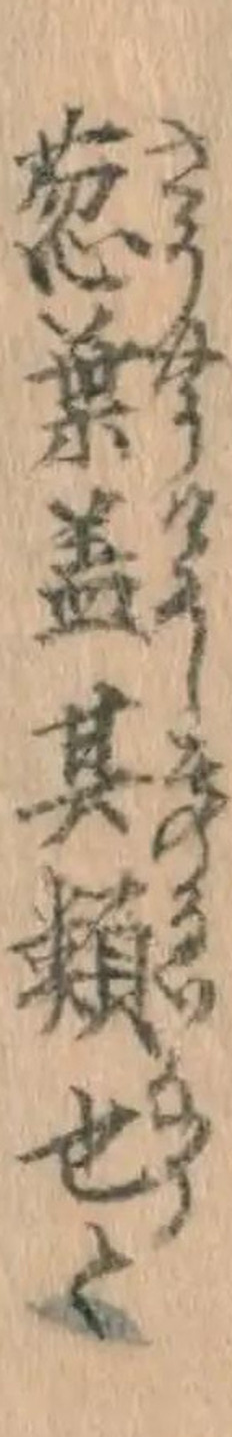葱葉蓋其類也と
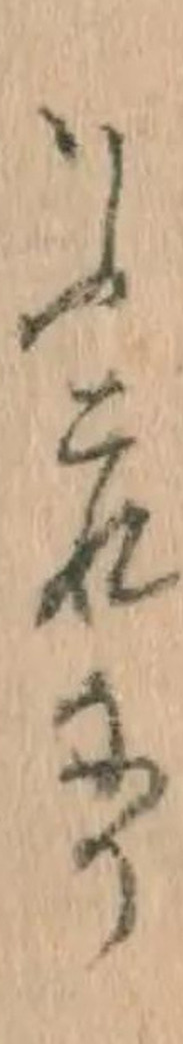いふこれなり

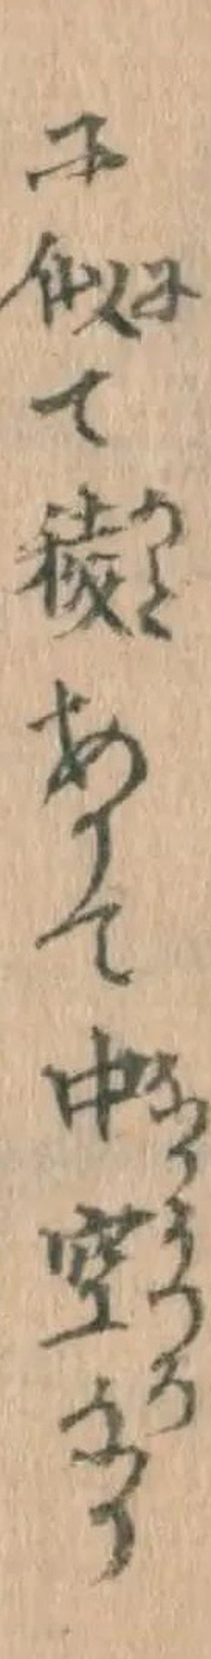に似て稜ありて中空なり
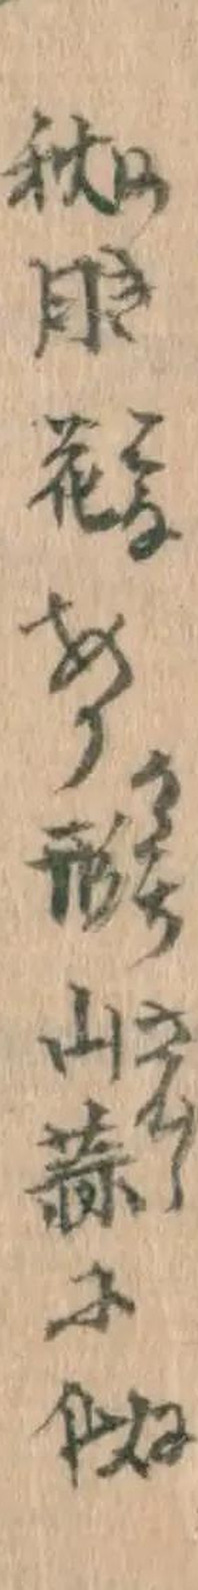秋月花あり形山蒜に似
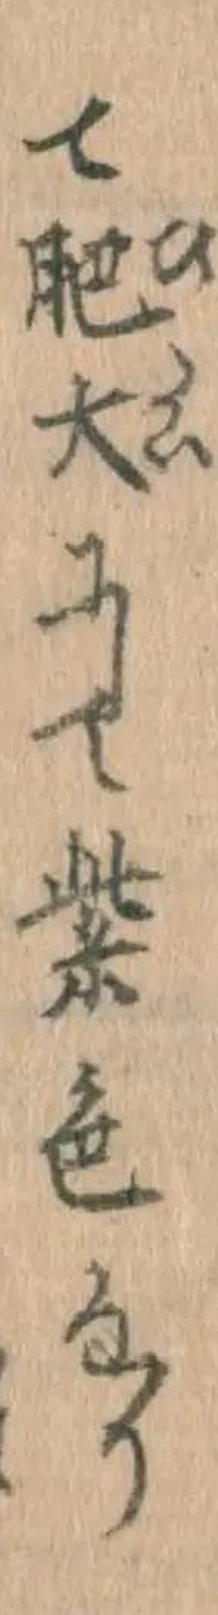て肥大にして紫色なり
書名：本草図譜. 巻43-45
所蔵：国立国会図書館 National Diet Library, JAPAN
